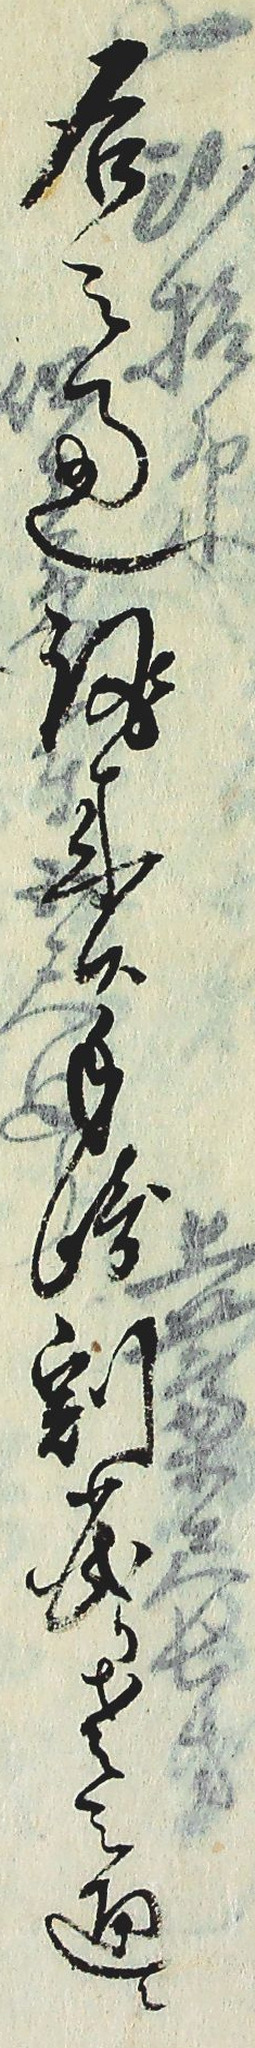右の通誂来候手崎割当り左之通に
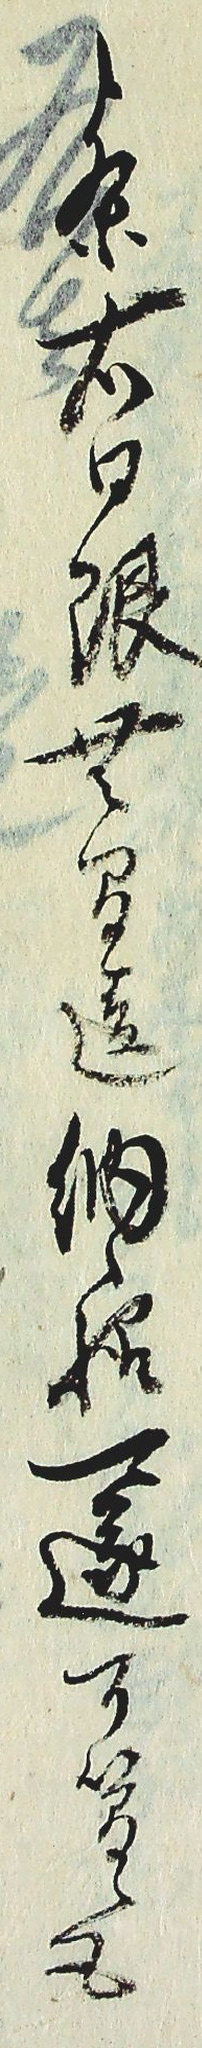候条右日限無間違納候様可遂了簡候以上
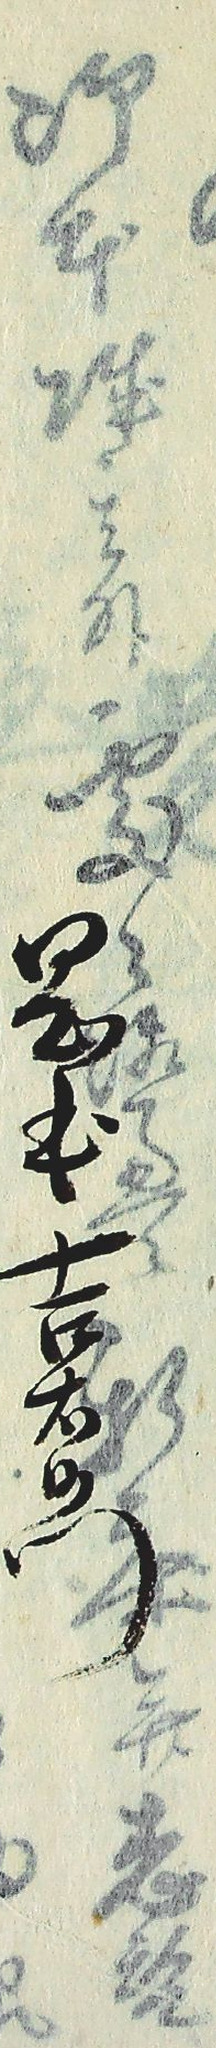岡本吉右衛門
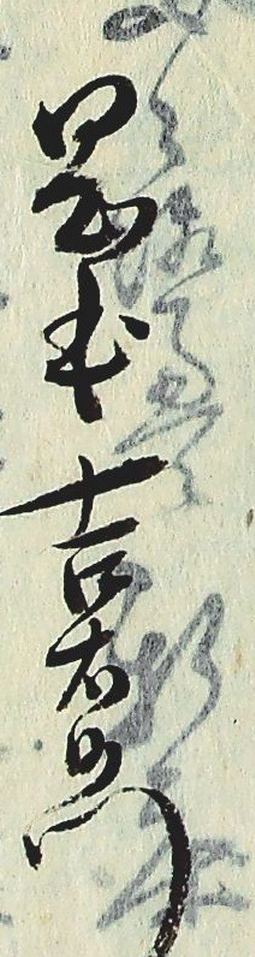岡本吉右衛門
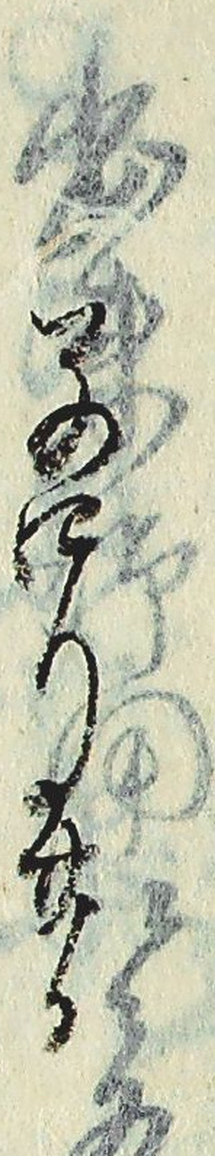子四月廿日
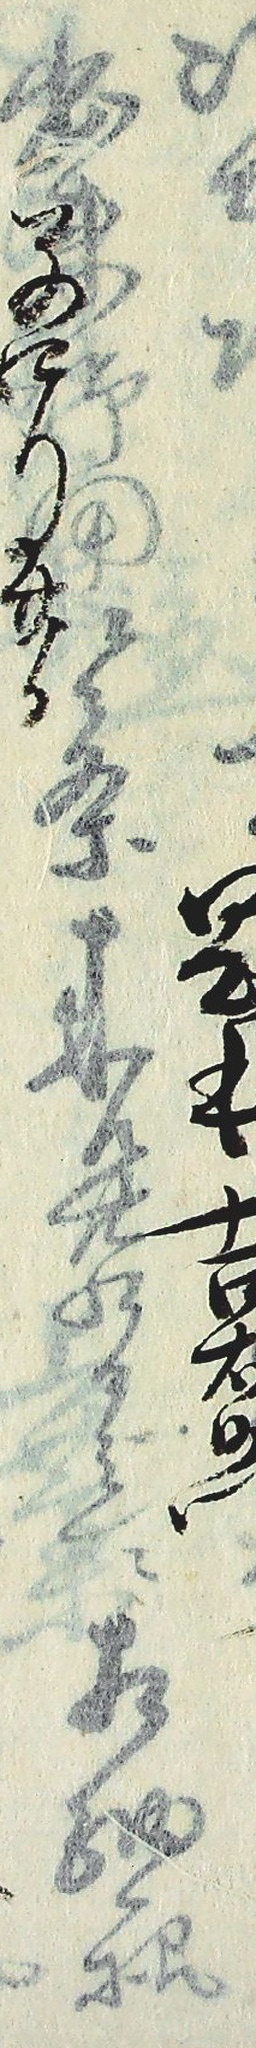子四月廿日
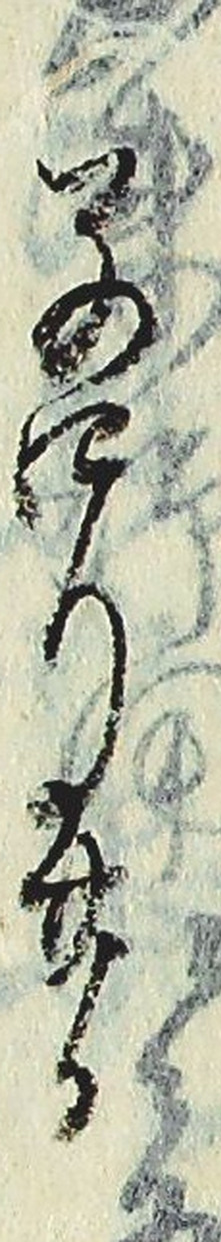子四月廿日
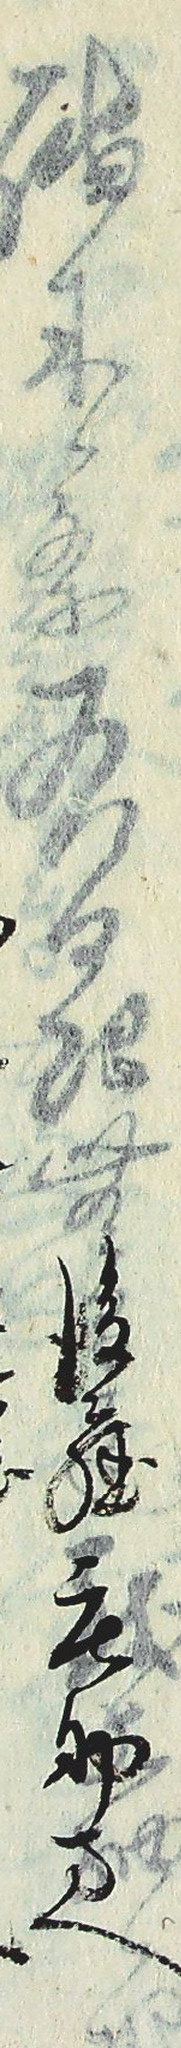後藤庄助方へ
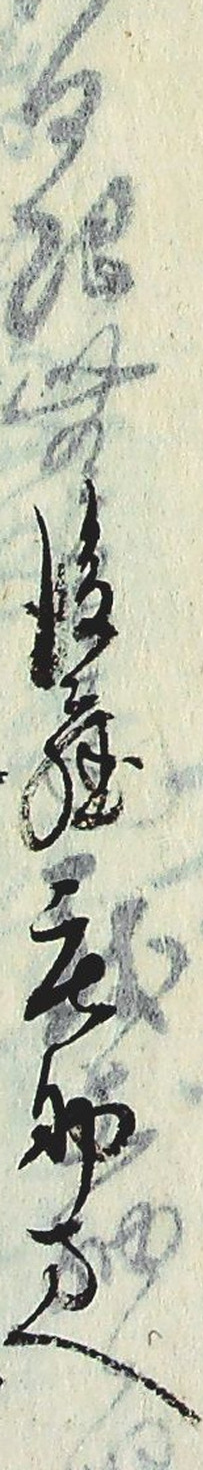後藤庄助方へ
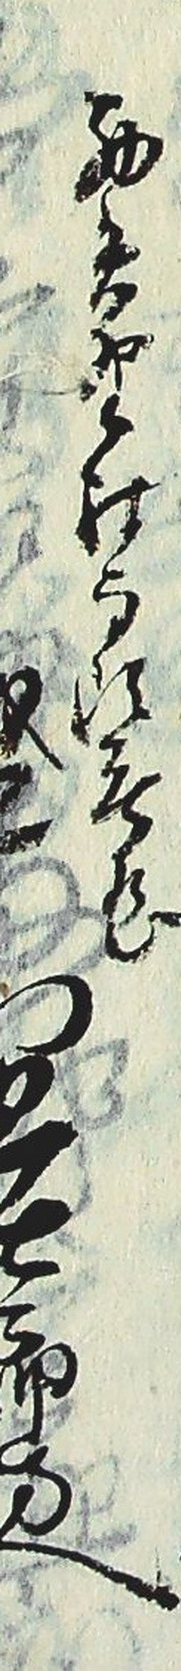西矢野村与頭庄屋
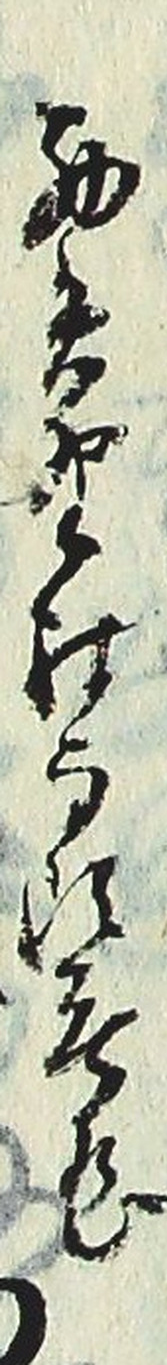西矢野村与頭庄屋
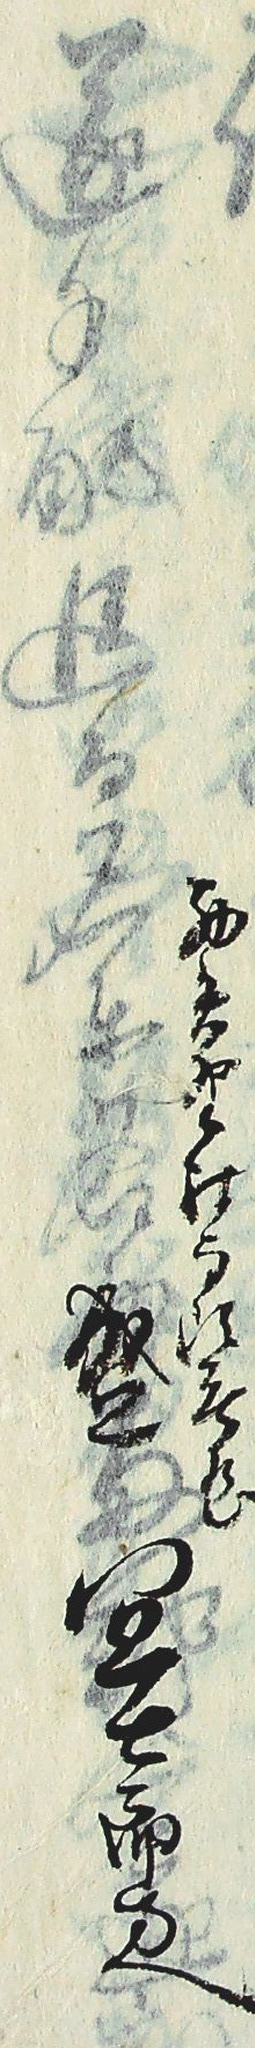盛宣七郎方へ
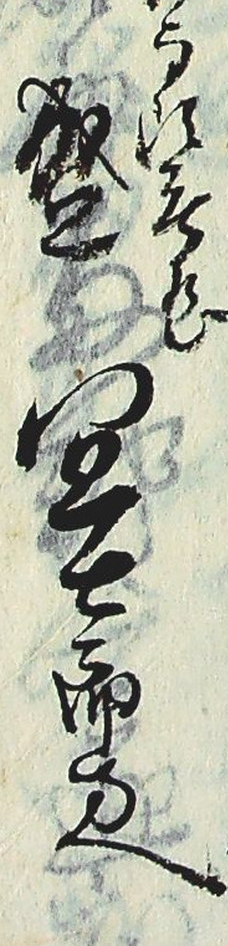盛宣七郎方へ

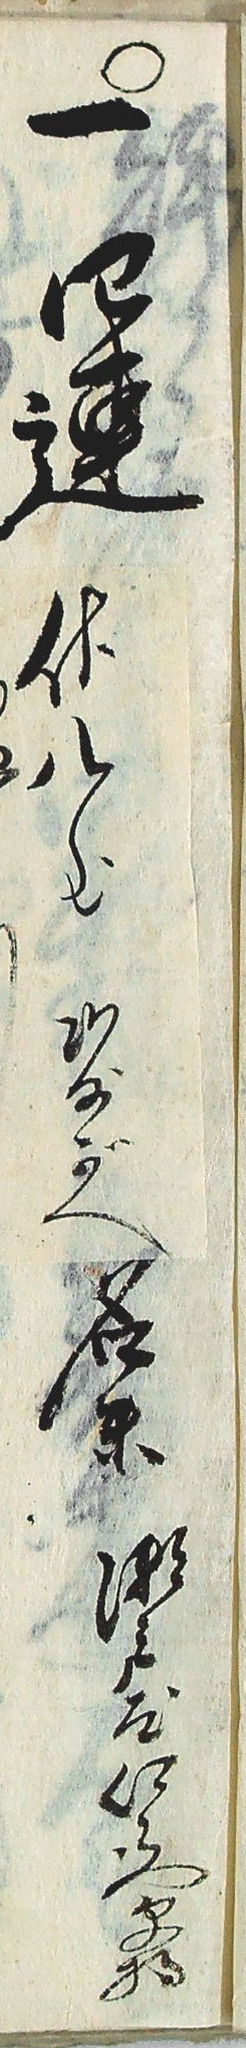一四連代八匁弐匁がへ名東瀬戸屋仁右衛門受持
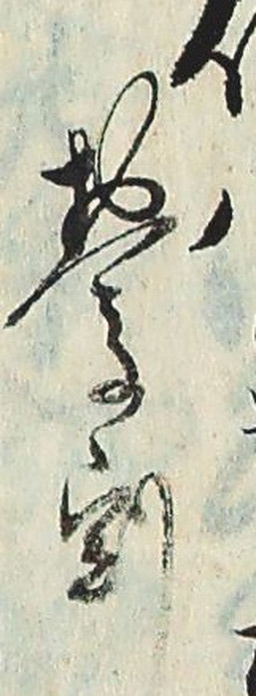惣高割
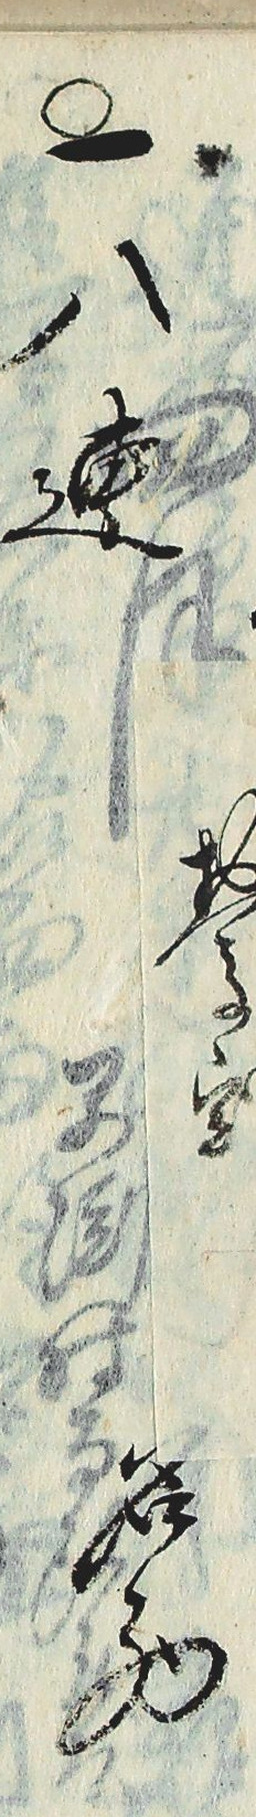一八連名西
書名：名東郡中諸割賦元帳
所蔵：鳴門教育大学 Naruto University of Education
